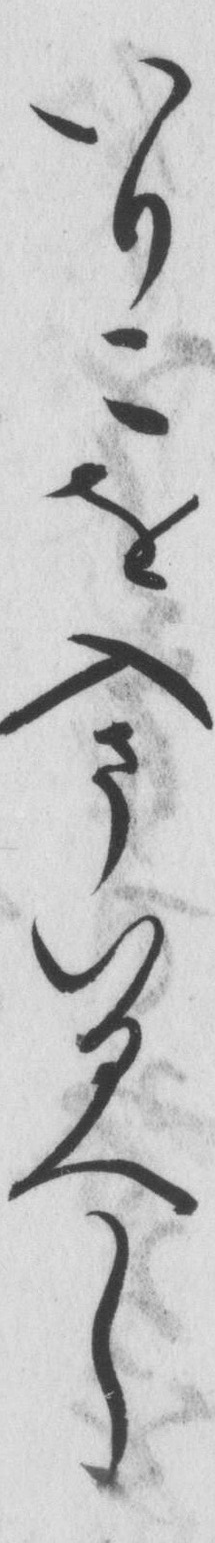いりこを入まいるへし
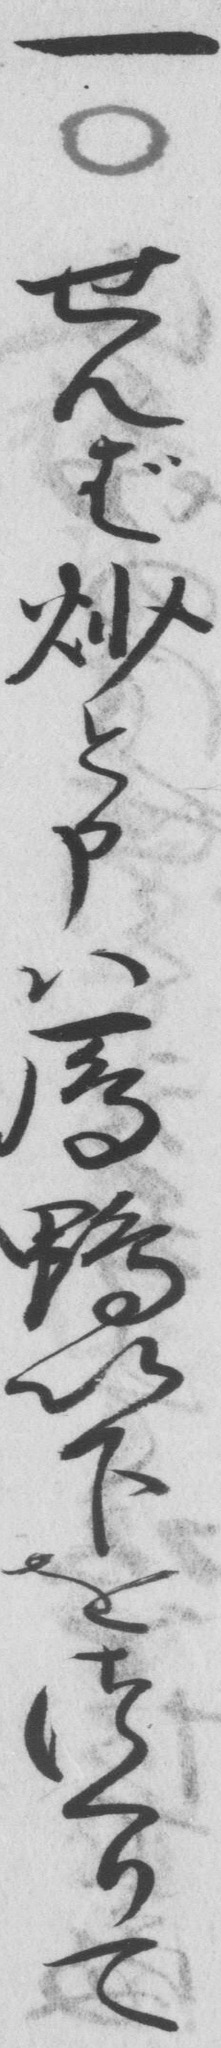一○せんば炒と申は雁鴨以下をつくりて
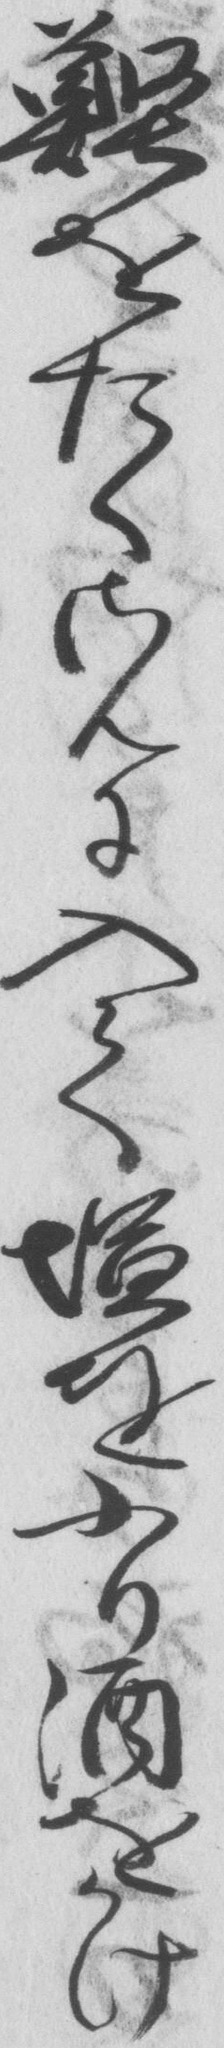鰹をたくさんに入て塩をふり酒をかけ
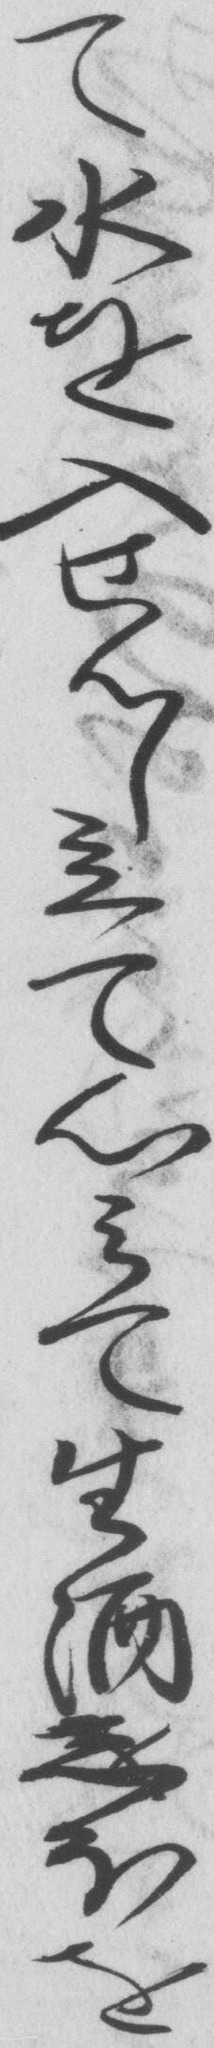て水を入せんし立て心みて生酒しほを
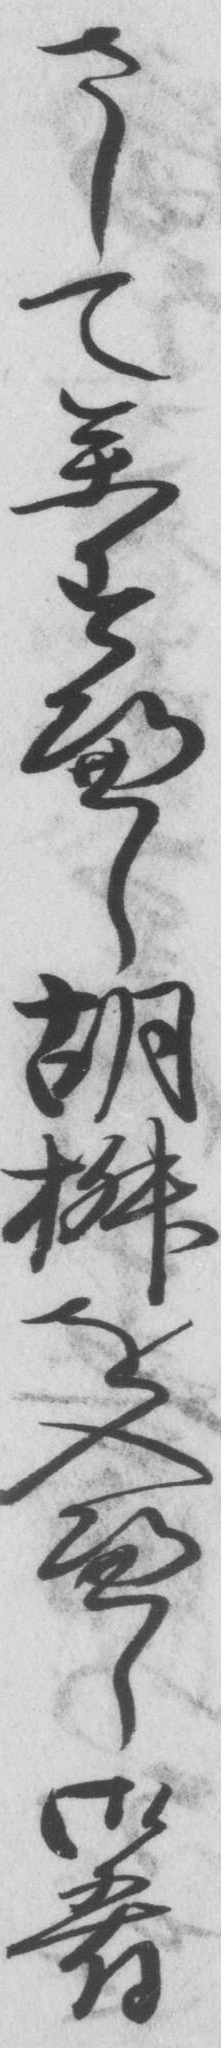さして参すへし胡椒を入へし御肴
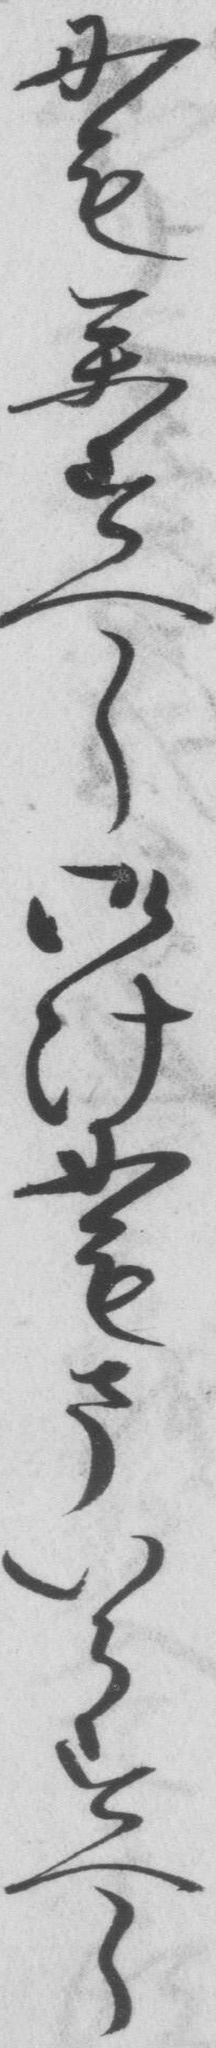にも参すへし御汁にもまいらすへし
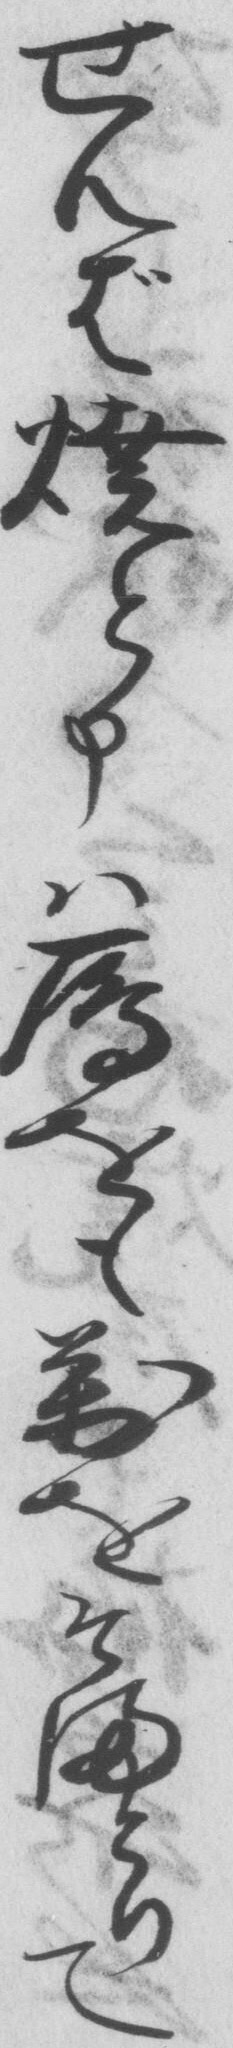せんば焼と申は雁をも万をそまとりて
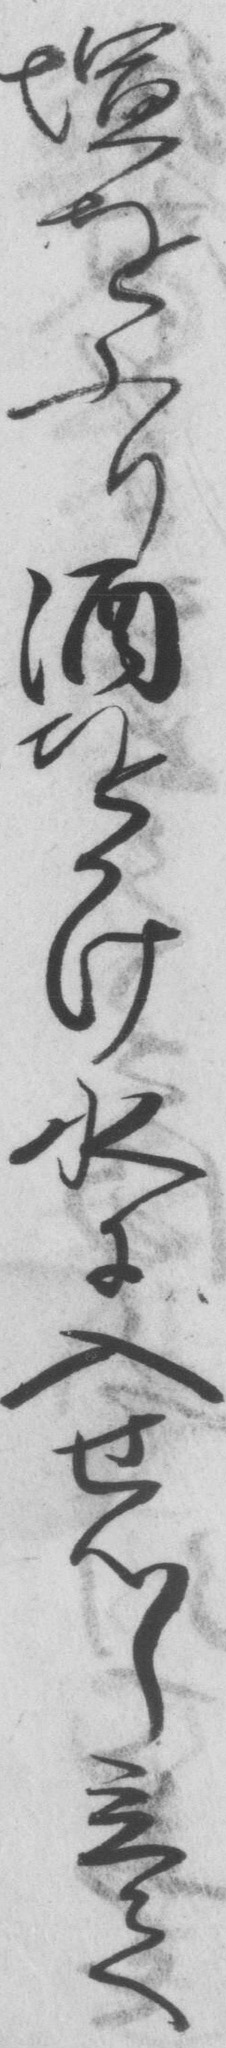塩をふり酒をかけ水に入せんし立て

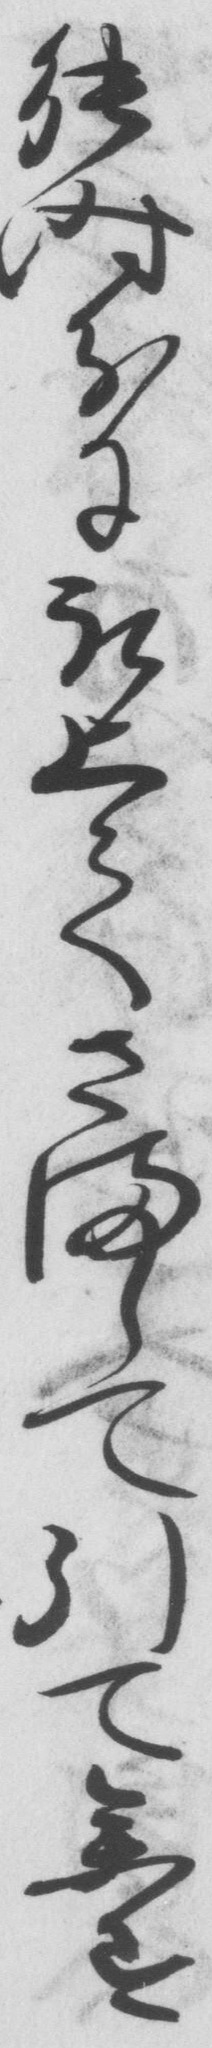能時分に取上てさまして引て参す
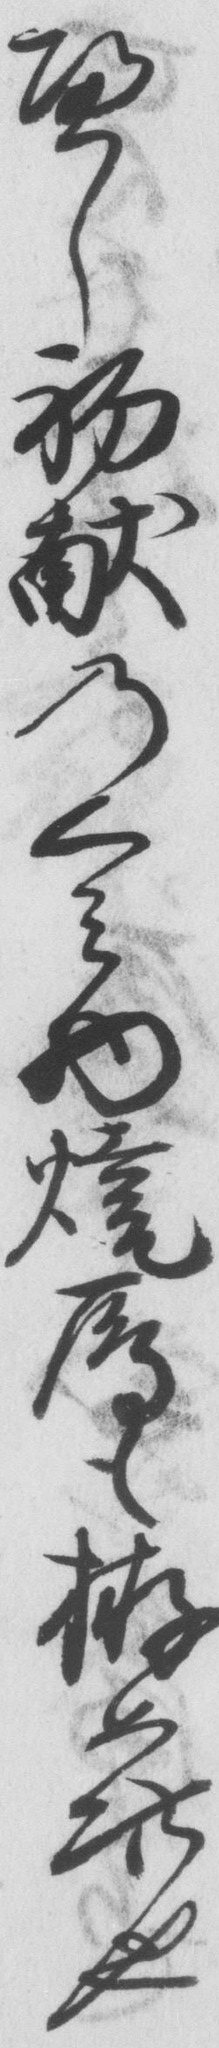へし初献のくみ物焼雁も拵如此也
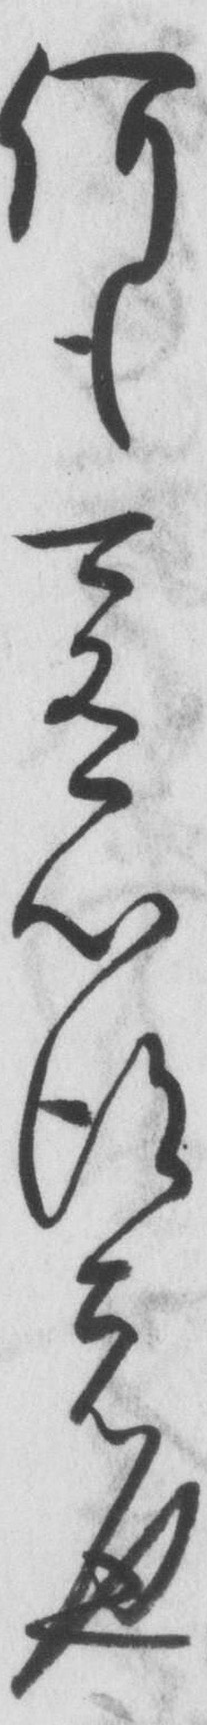何も可有心得者也
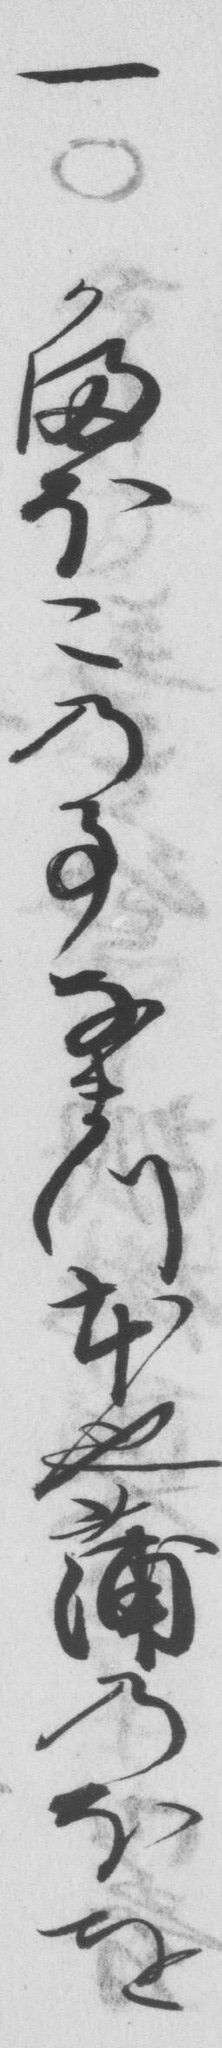一○かまほこの事なまつ本也蒲のほを
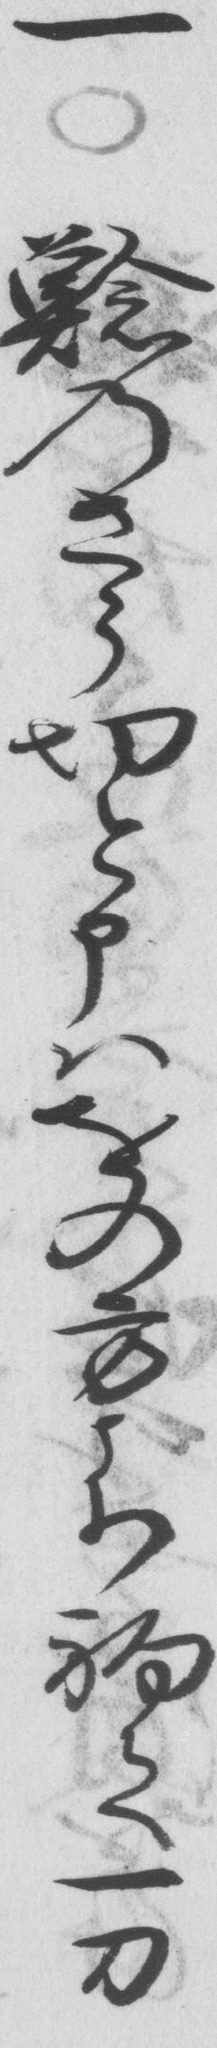一○鯰のさら切と申はをの方より初て一刀
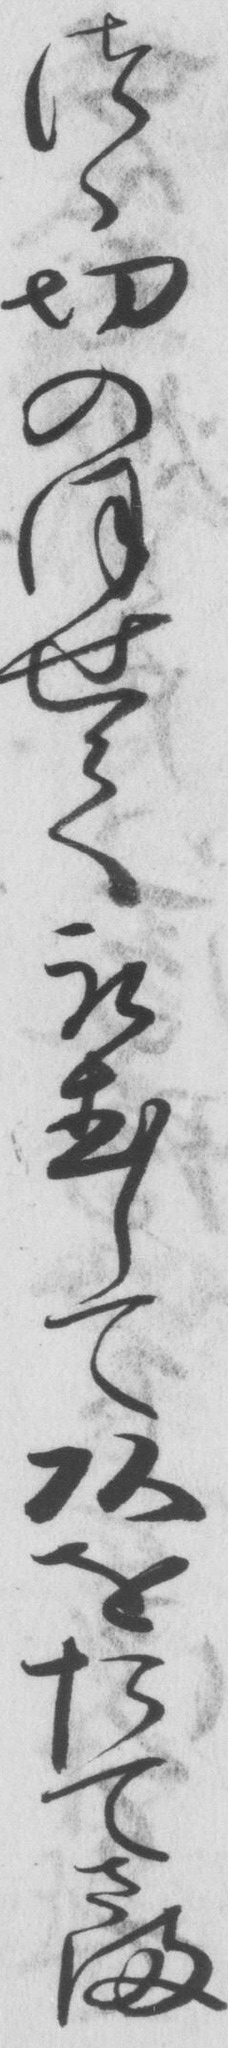つゝ切のほせて取置候て頭をたてさま
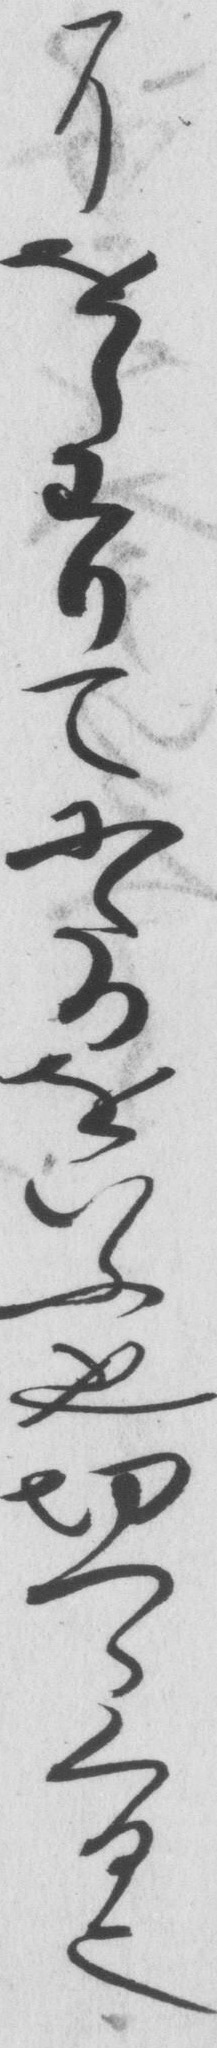にをしわりてにたるをいふ也切つゝくる也
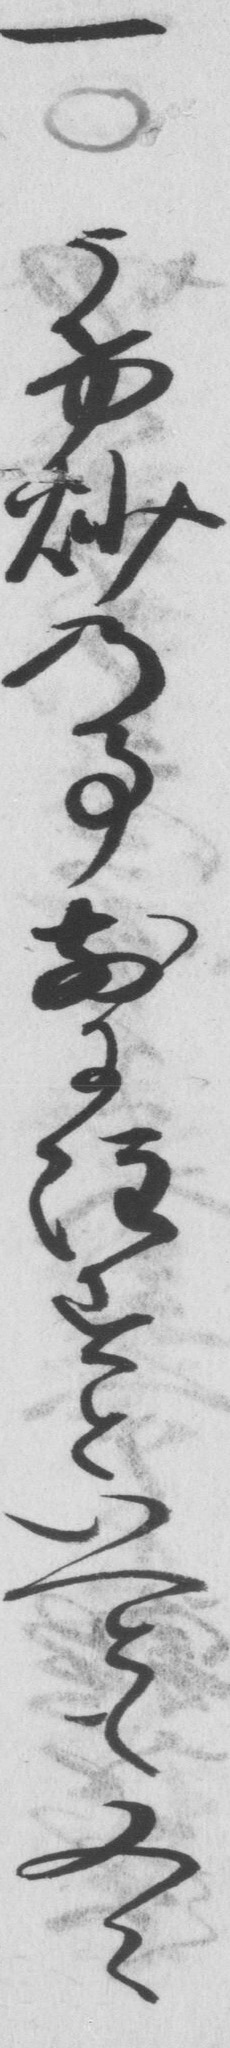一○うけ炒の事前に註すといへとも又々
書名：料理次第
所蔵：大阪府立大学学術情報センター 国文学研究資料館
